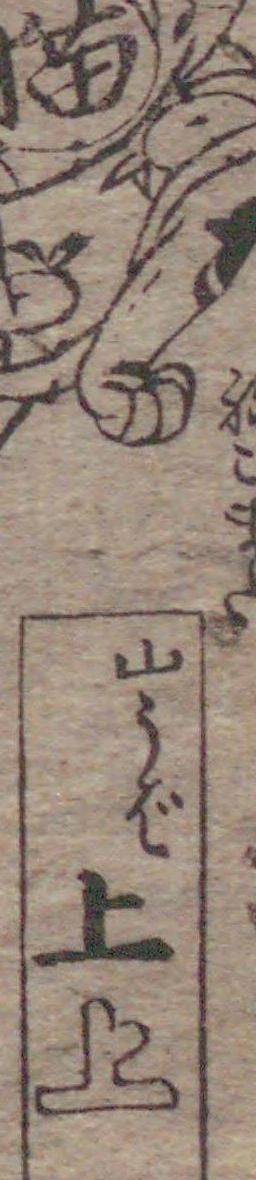山うば上上
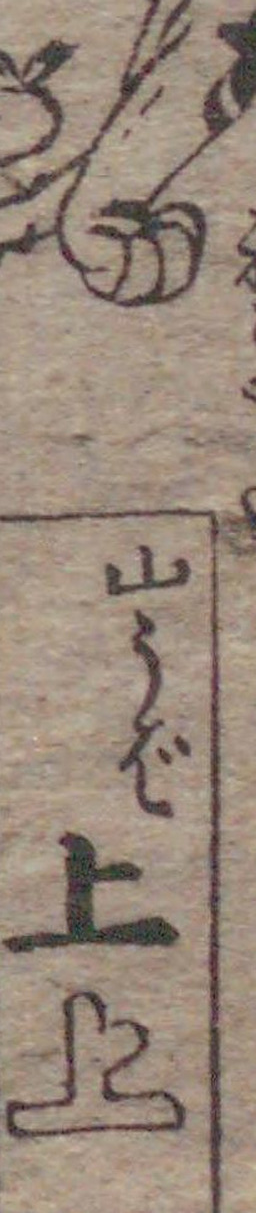山うば上上
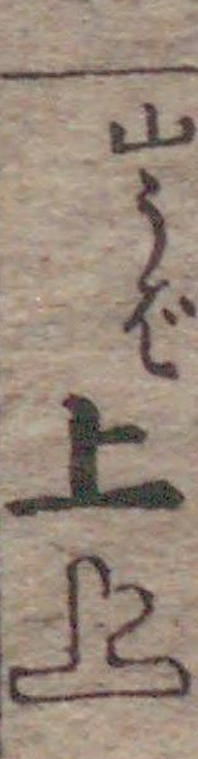山うば上上
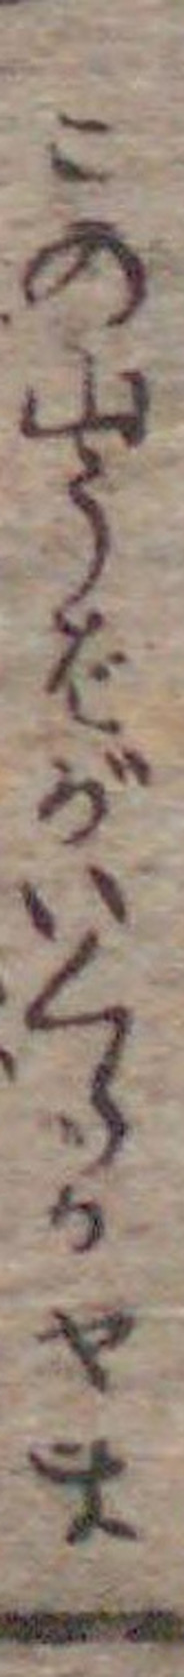この山うばがいくらかやま
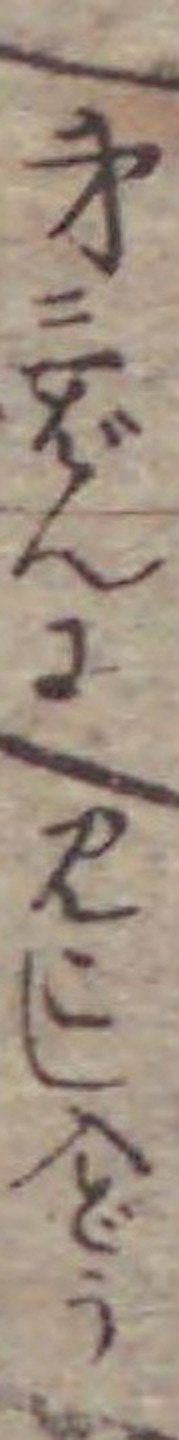第三ばんに見こし入どう
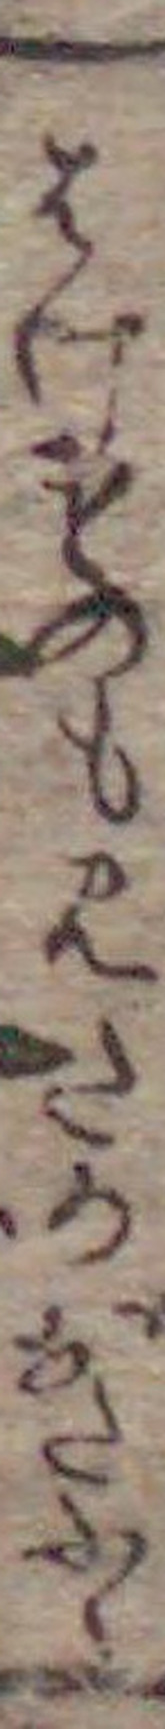はけものも見たかおたふく
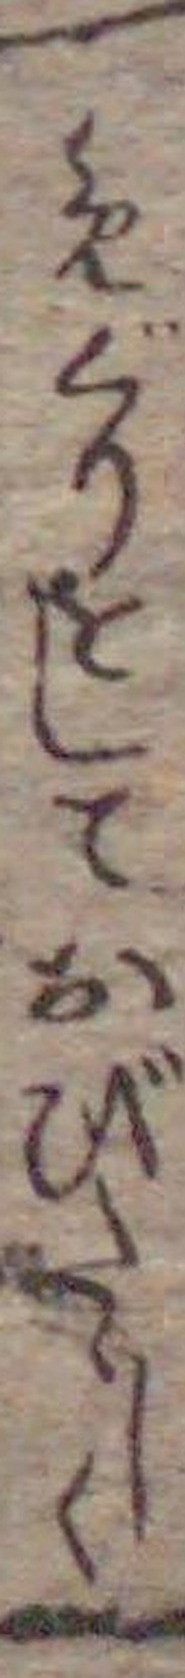めぐりをしておびたゝしく
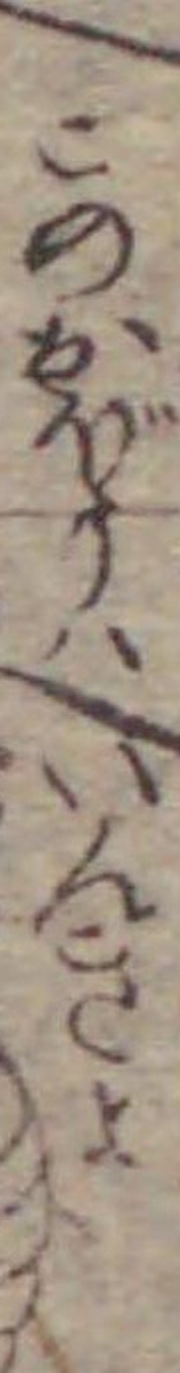このおぼうはいんきょ
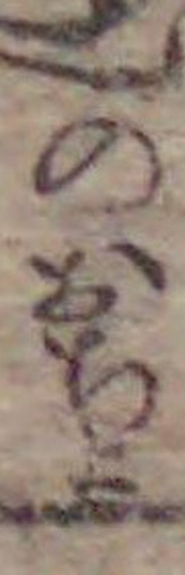のおちよ
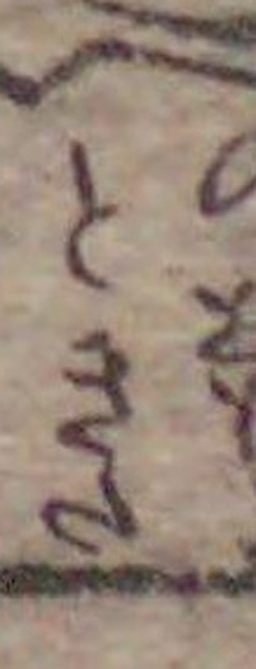ときた
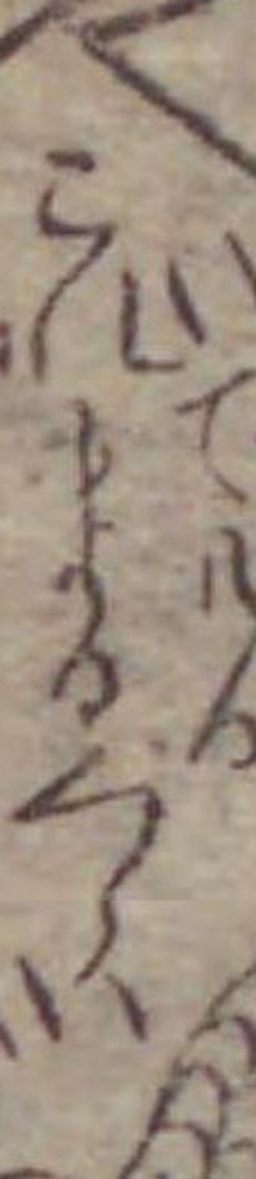これもよるくらい
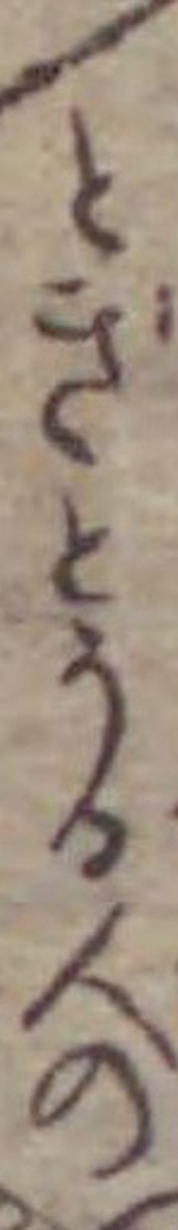ときとうる人の
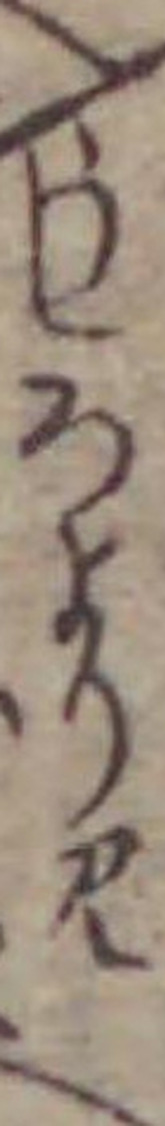うしろより見
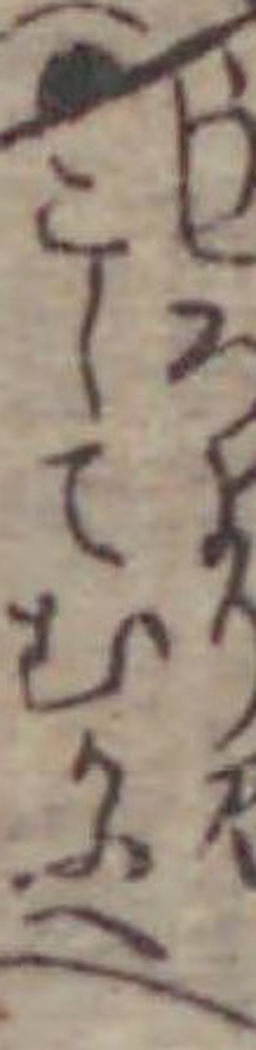こしてむかふへ
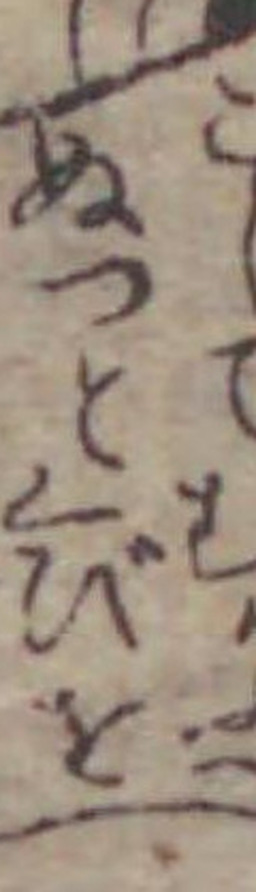ぬつとくびを
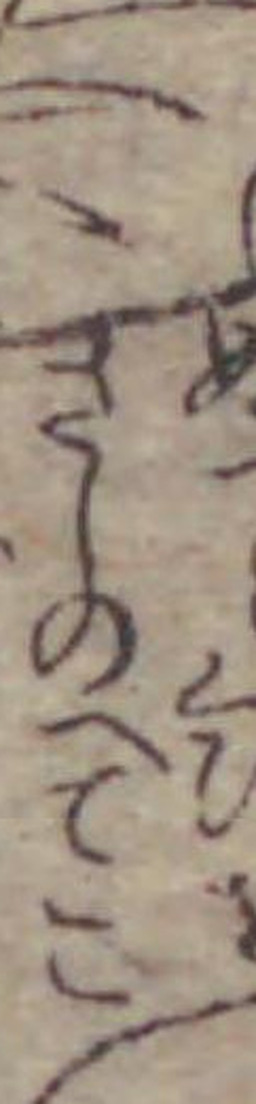さしのへてこ
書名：妖怪仕内評判記 : 2巻
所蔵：国立国会図書館 National Diet Library, JAPAN
